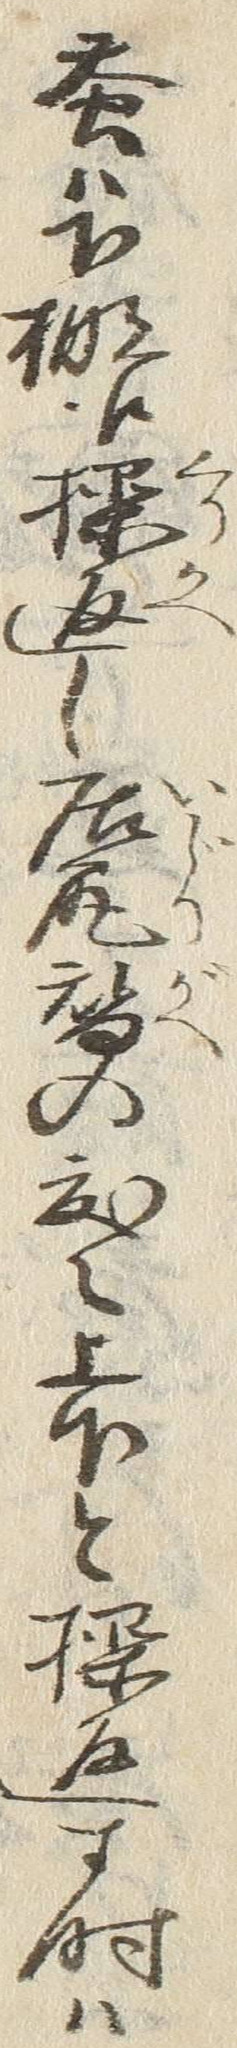蚕は下棚江操返し居尻替の度に上下と操返す時は
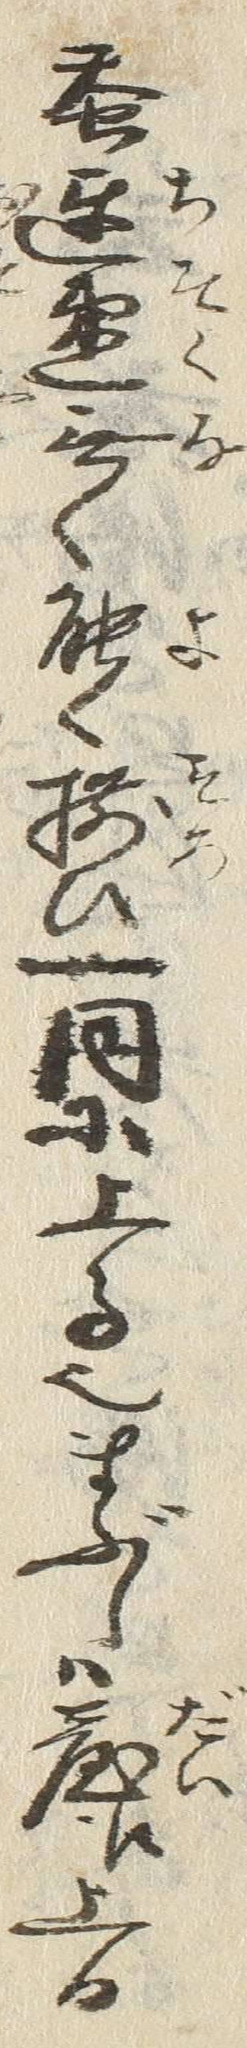蚕遅速無く能く揃ひ一同に上る也まぶしは臺江上る
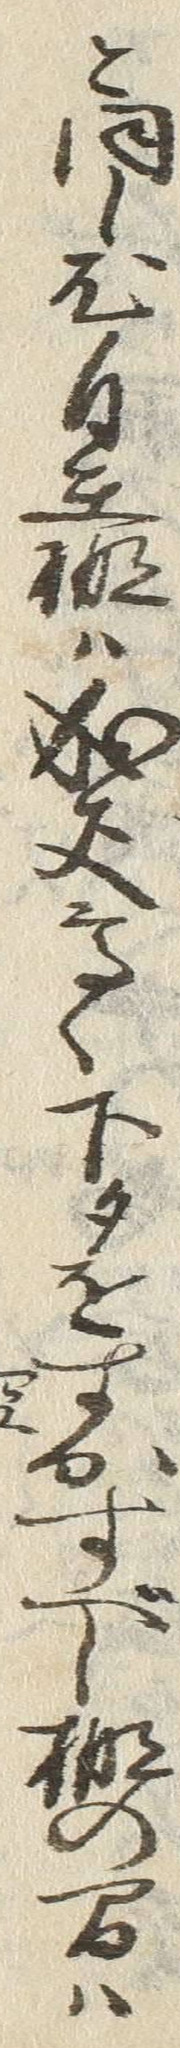と同し尤自在棚は成丈高く下タをすかすべし棚の間は
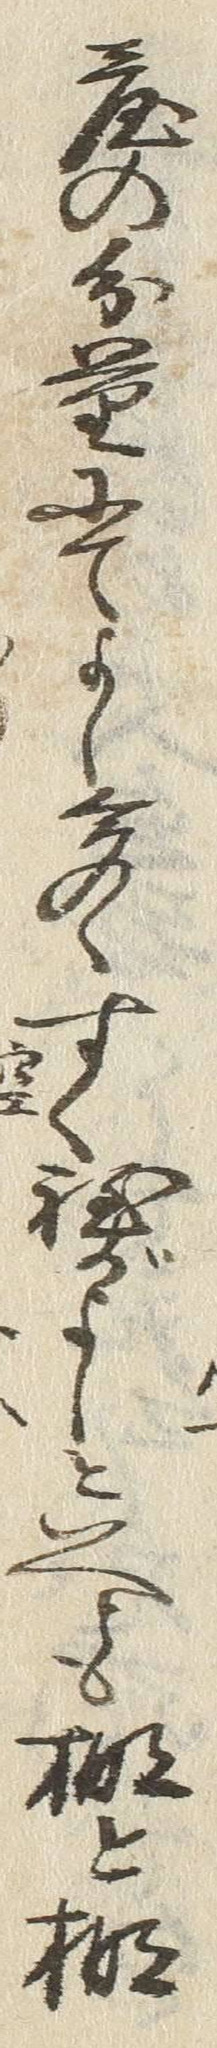臺の分量尓てよし多くすく程がよしといへとも棚と棚
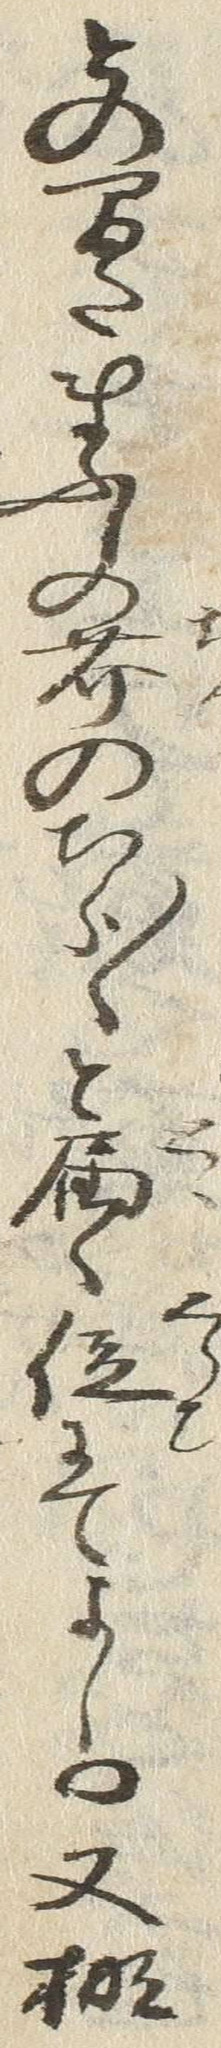との間たまふしの芥のちら〳〵と届く位尓てよし〇又棚
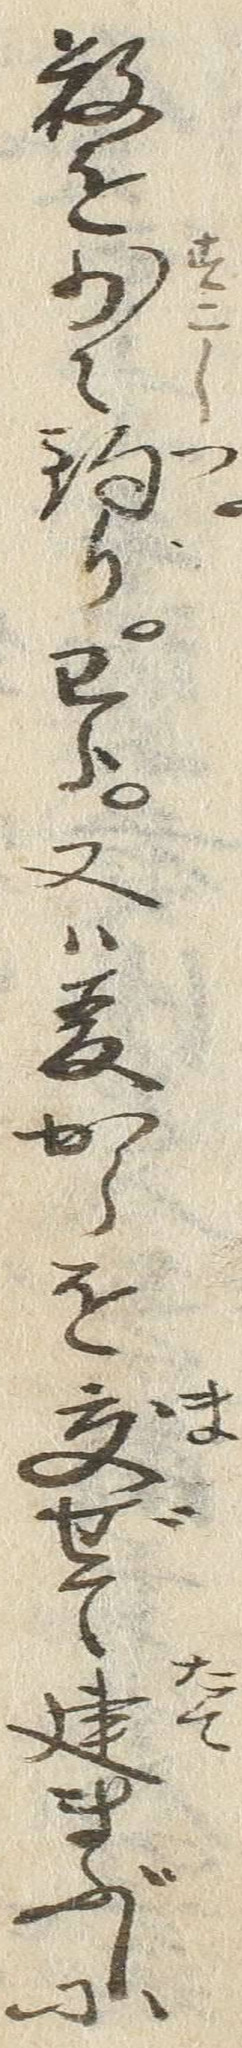数を少し釣り。わら。又は麦からを交ぜて建まぶし尓
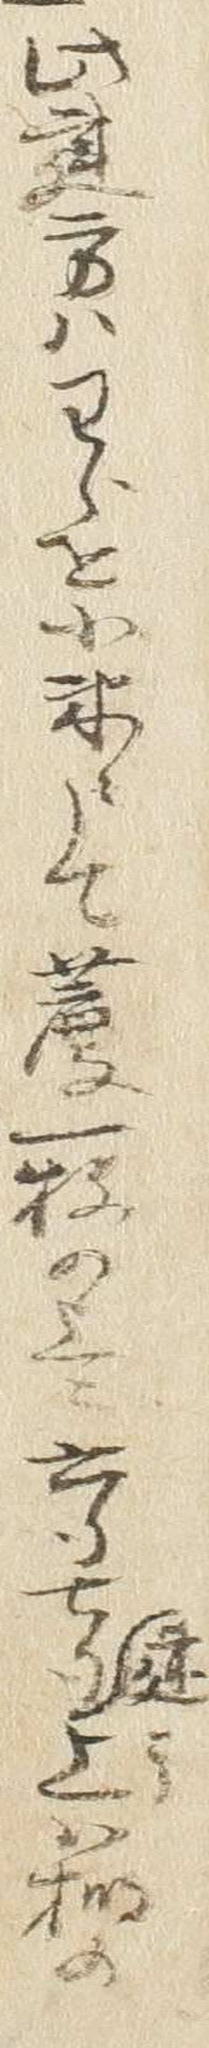但此建方はわらを小束にして薦一枚の上に六分七分建上は棚の
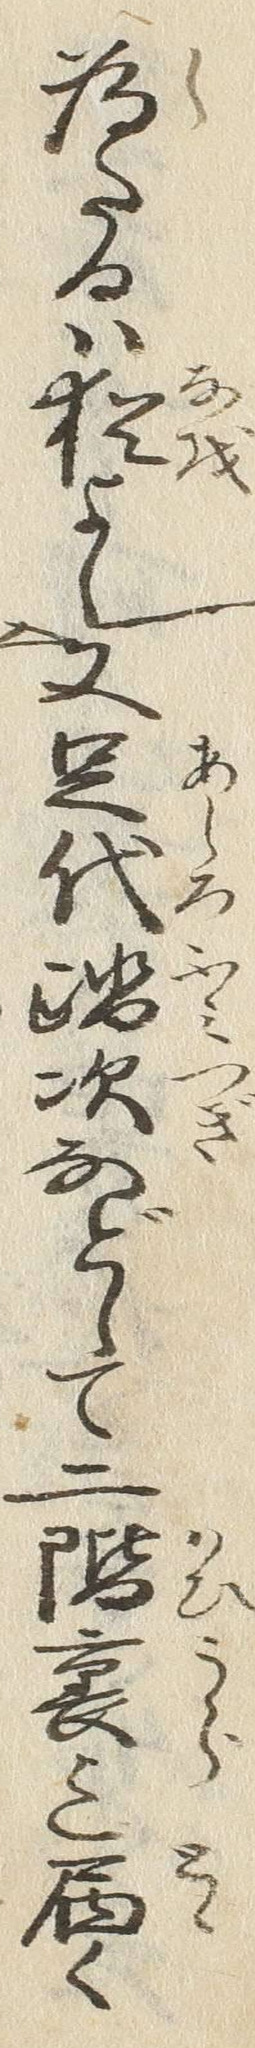為たるは猶よし△又足代踏次などして二階裏迄届く
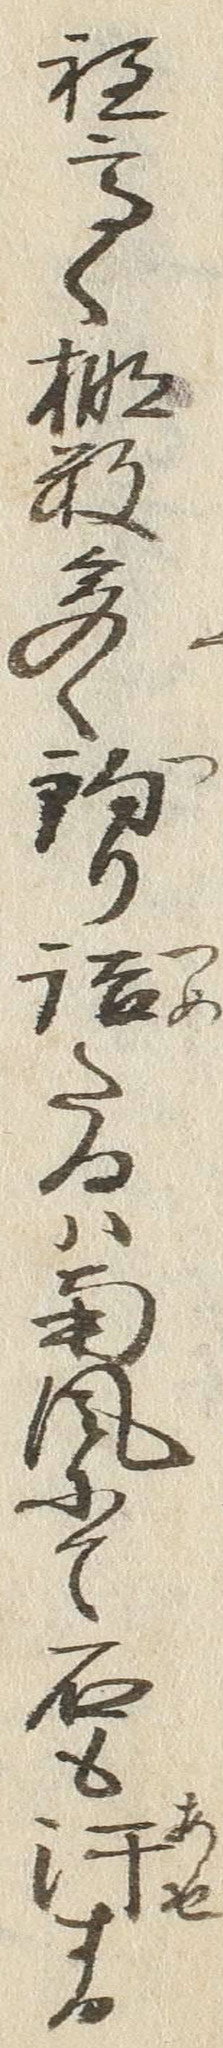程高く棚数多く釣り詰たるは南風尓て石も汗する
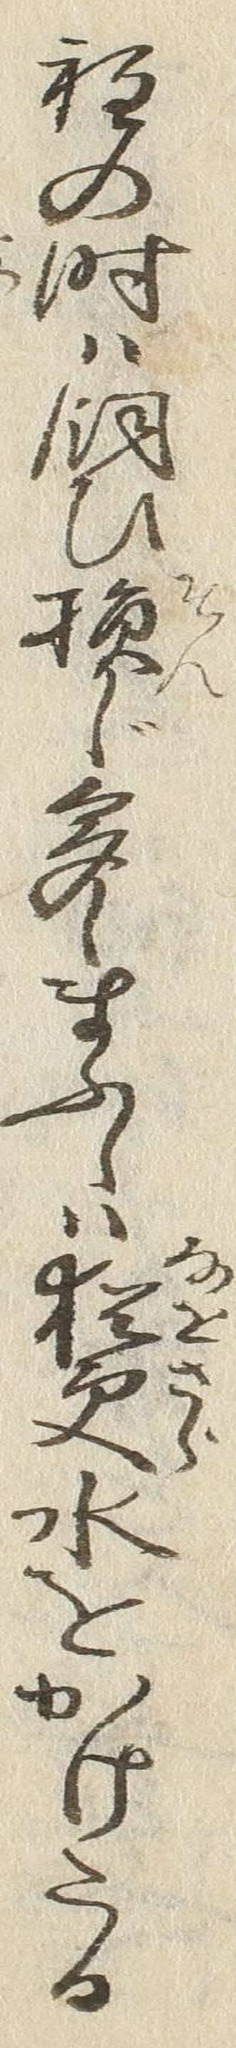程の時は飼ひ損じ多しまふしは猶更水をかけたる
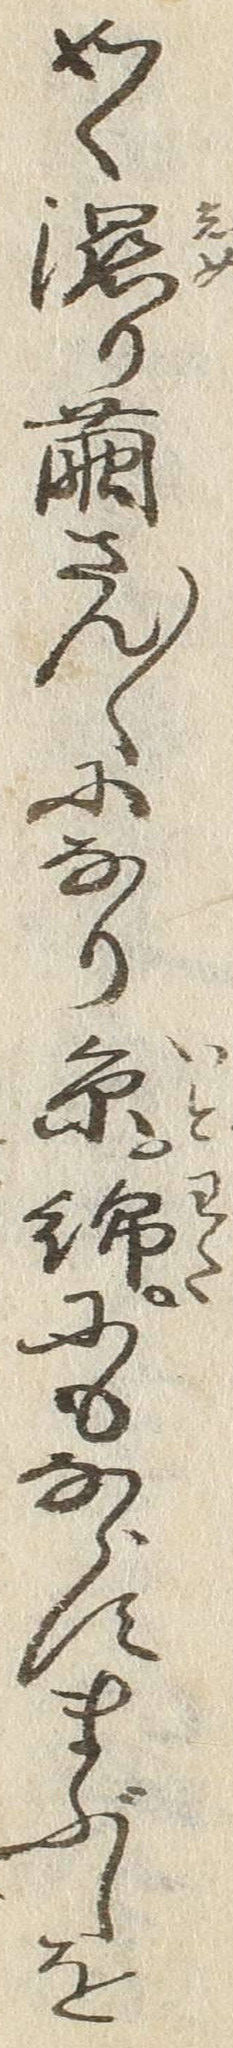如く湿り繭さん〳〵尓なり糸。綿。尓もなら須まぶしを
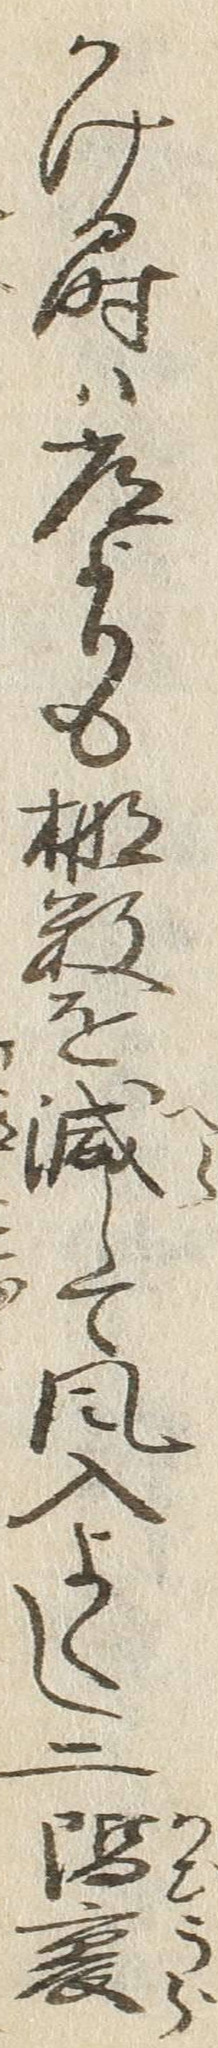かける時は常よりも棚数を減して風入よくし二階裏
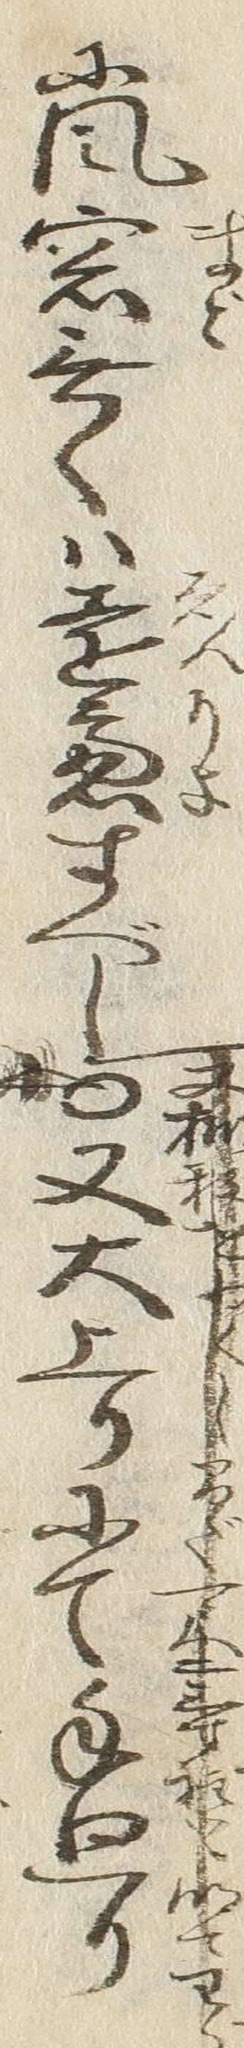尓風窓無くは遠慮すべし〇又大上り尓て手廻り
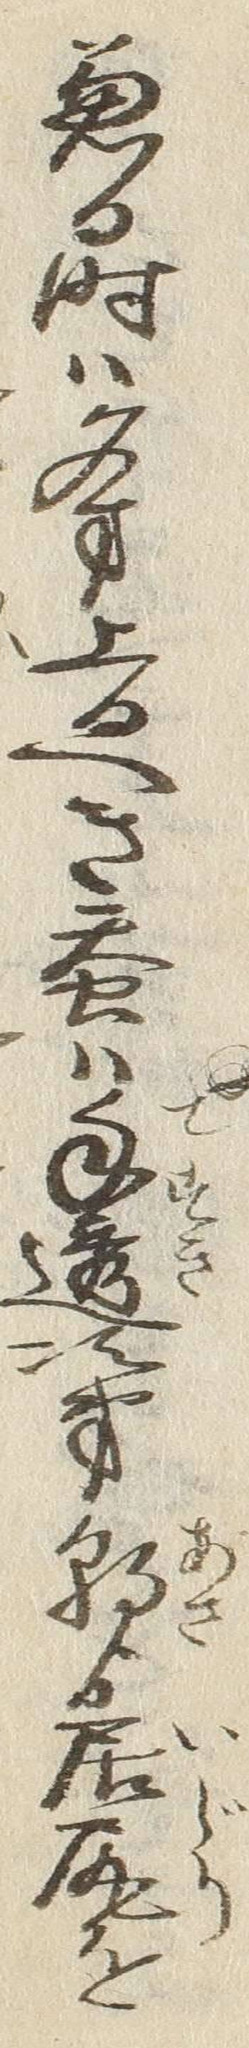兼る時は夕方上るへき蚕は手透次第朝ゟ居尻を
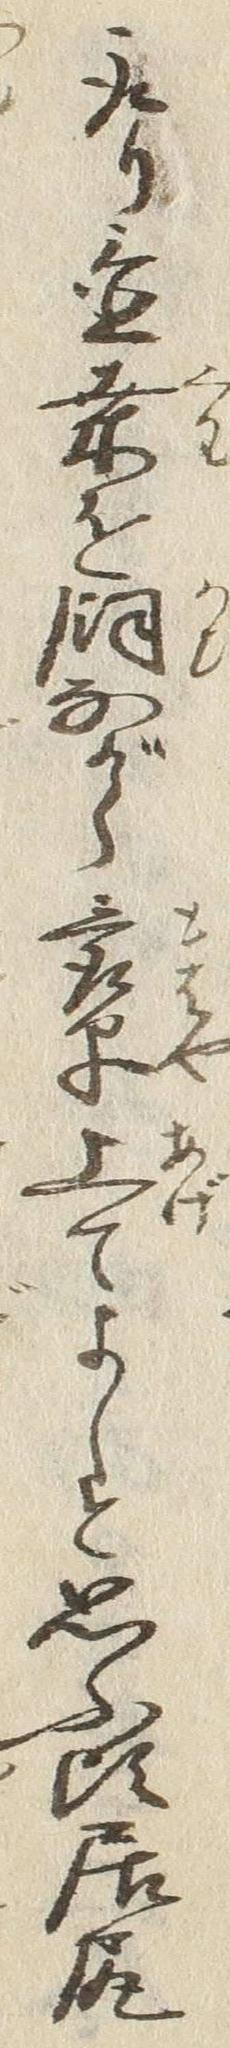取り置桑を飼ながら最早上てよしと思ふ頃居尻
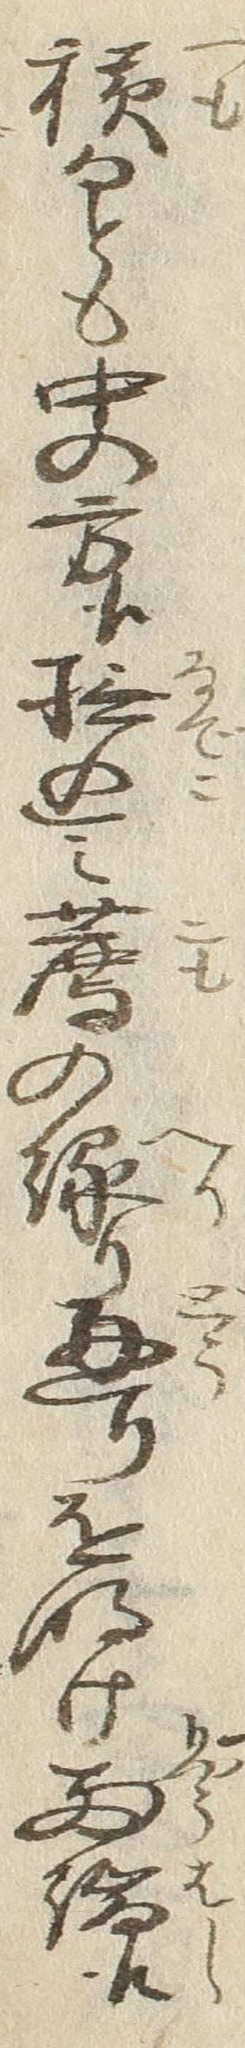積るとも中の方江撫込み薦の縁り通りを明け両端江
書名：養蠶實驗録後編
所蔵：東京大学農学生命科学図書館 国文学研究資料館
